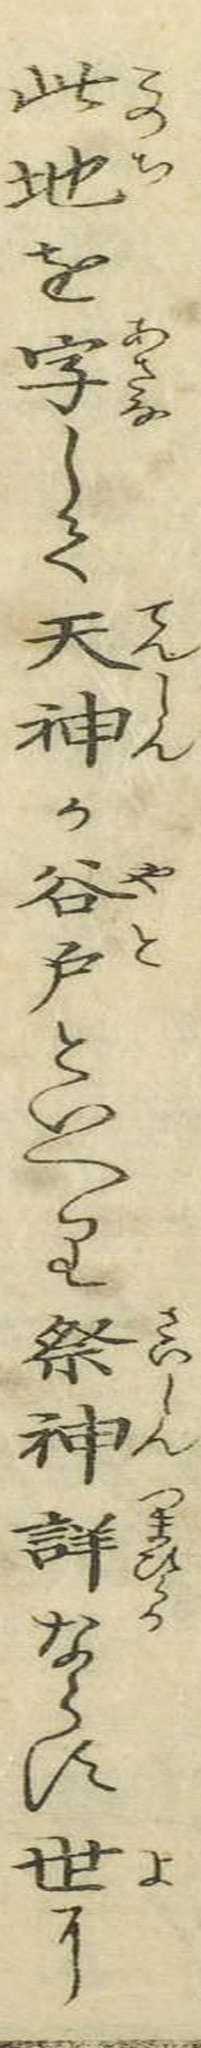此地を字して天神か谷戸といへり祭神詳ならす世に
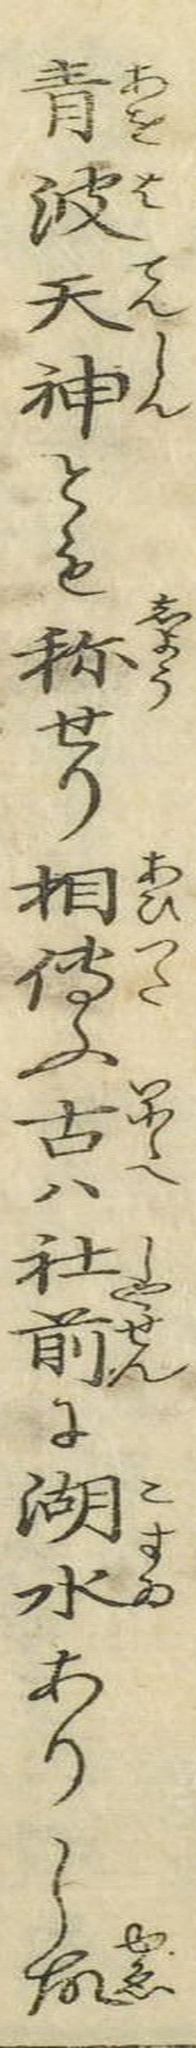青波天神とも称せり相傳ふ古は社前に湖水ありし故
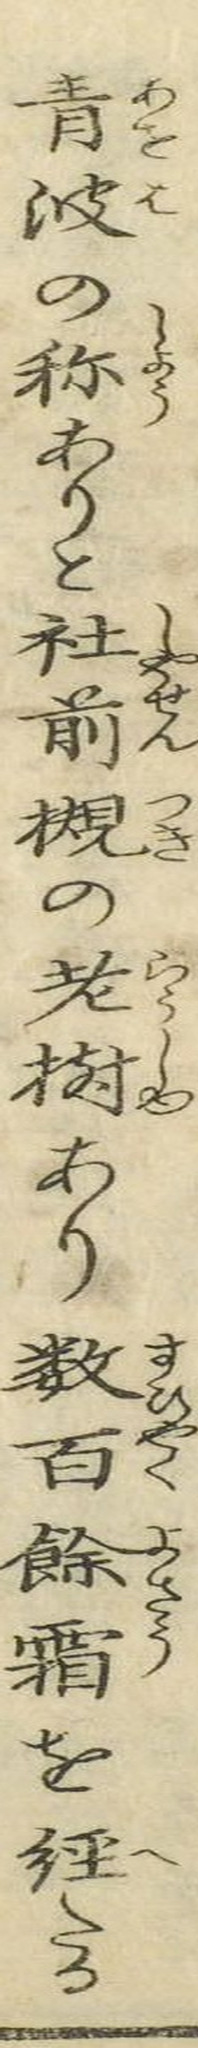青波の称ありと社前槻の老樹あり数百余霜を経たる
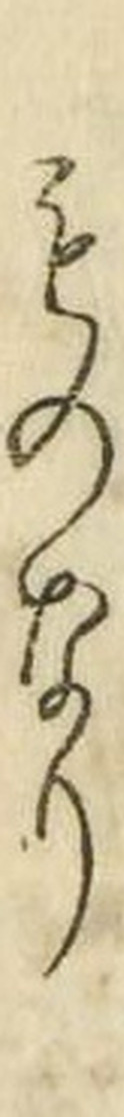ものなり
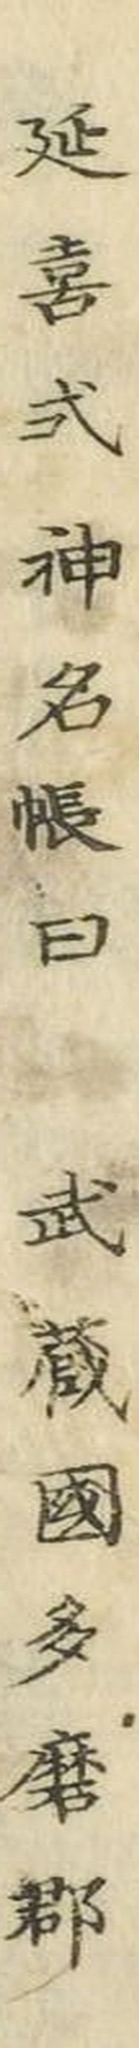延喜式神名帳曰武蔵国多磨郡
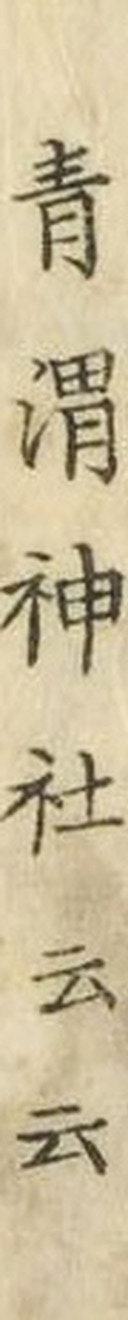青渭神社云々
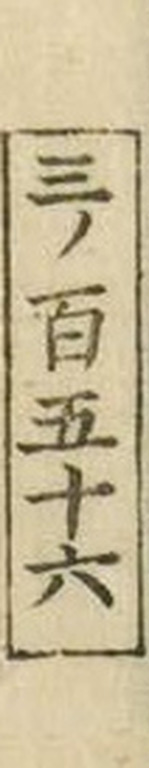三ノ百五十六
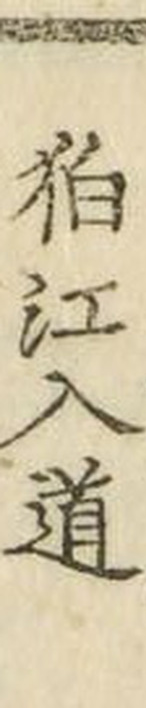狛江入道
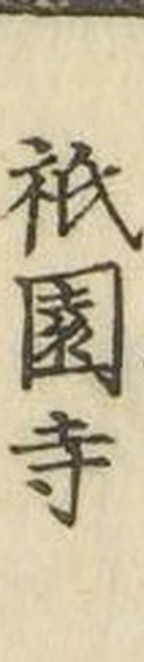祇園寺

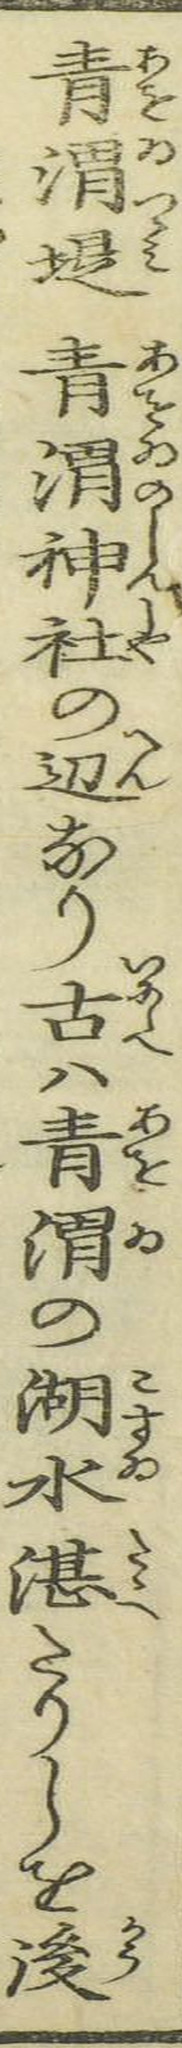青渭堤青渭神社の辺なり古は青渭の湖水湛たりしを後
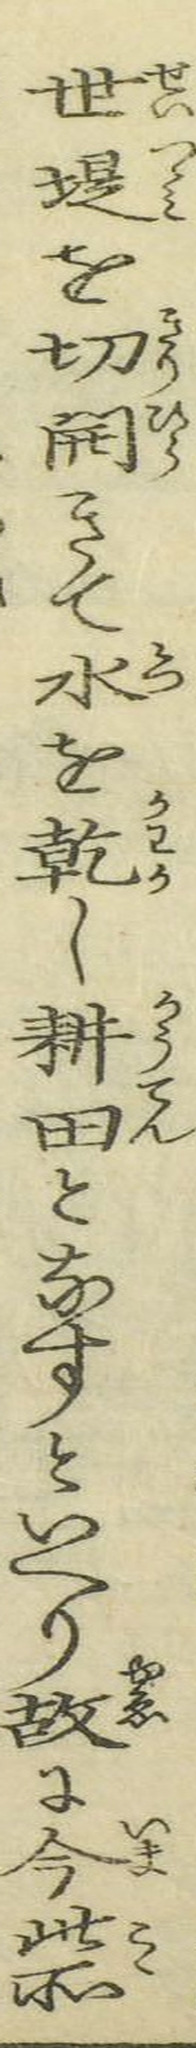世堤を切開きて水を乾し耕田となすといへり故に今此所
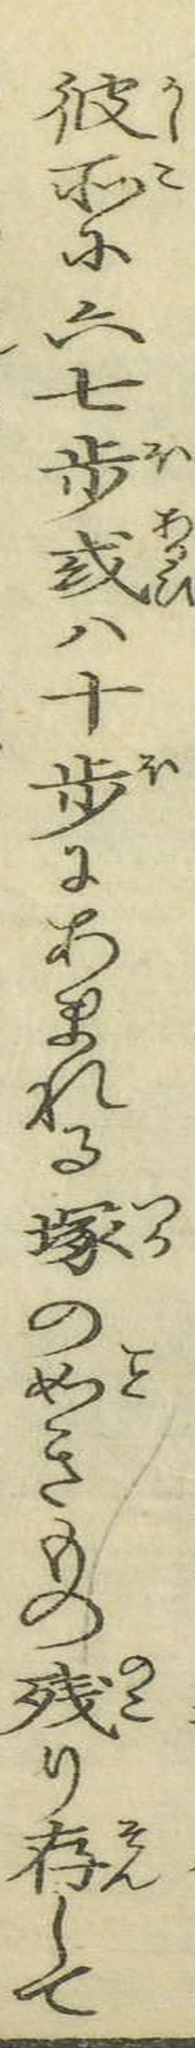彼所に六七歩或は十歩にあまれる塚の如きもの残り存して
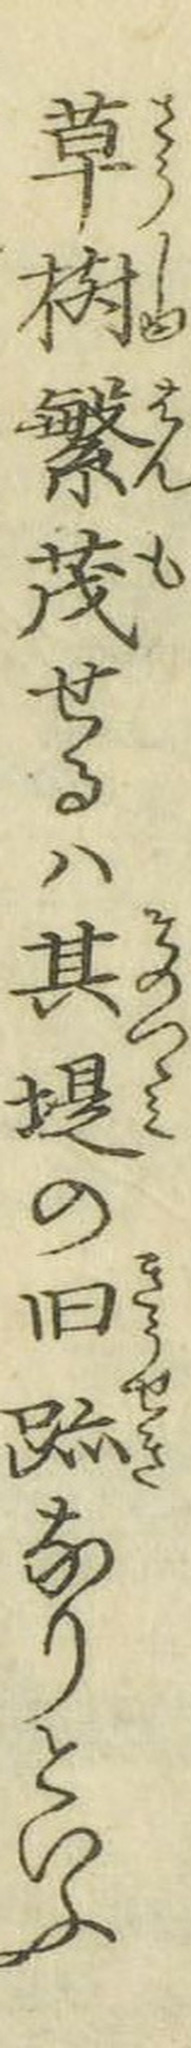草樹繁茂せるは其堤の旧跡なりといふ
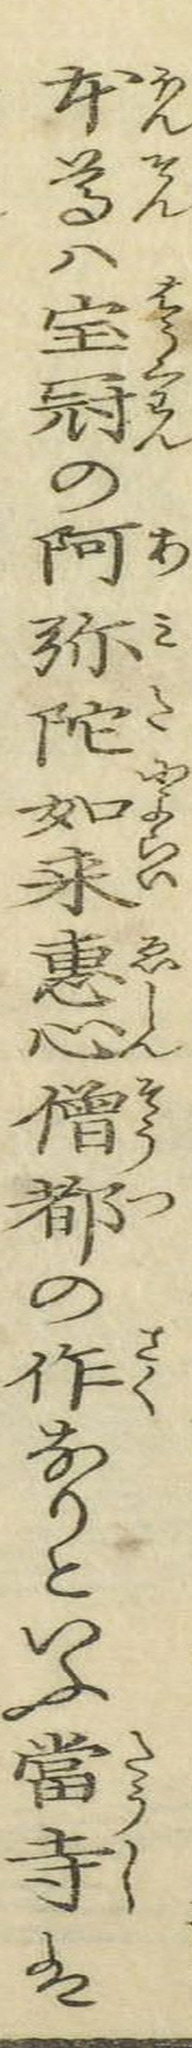本尊は宝冠の阿弥陀如来恵心僧都の作なりといふ当寺は
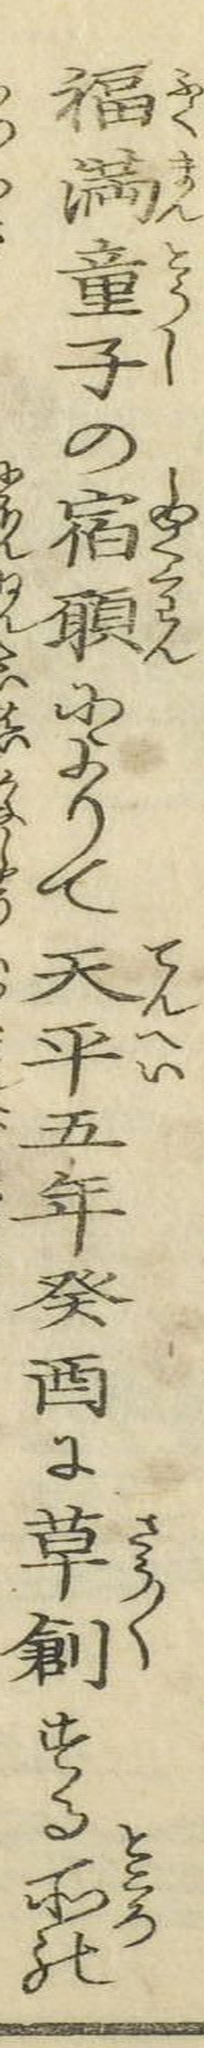福満童子の宿願によりて天平五年癸酉に草創する所の
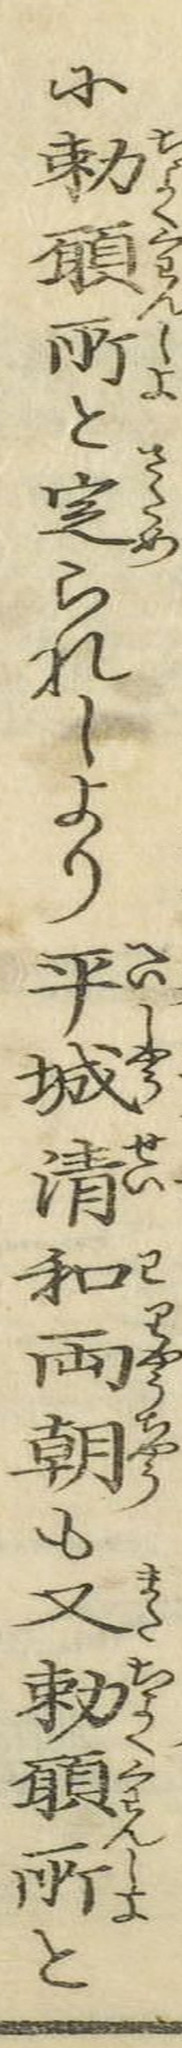に勅願所と定られしより平城清和両朝も又勅願所と
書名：江戸名所図会 20巻 巻之9
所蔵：東京学芸大学教育コンテンツアーカイブ
